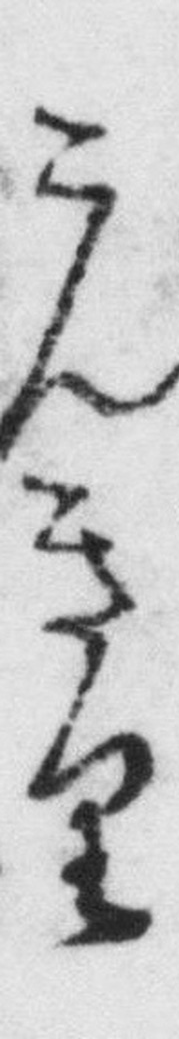こんきり
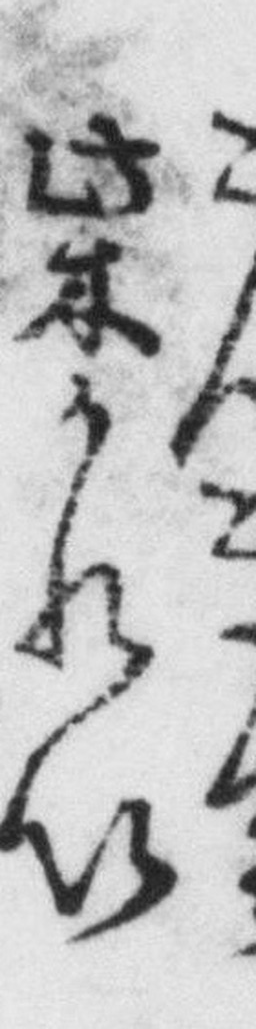五葉かれい

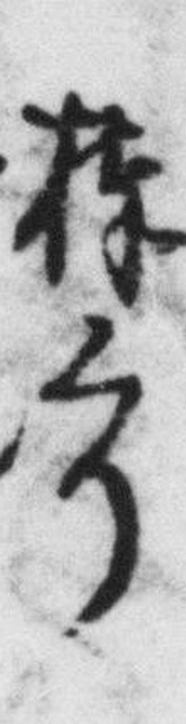棒くり
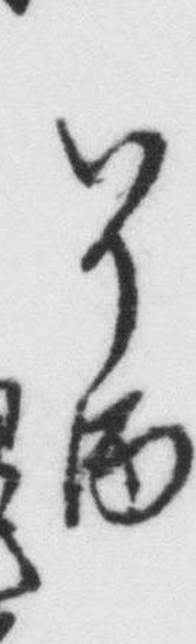いり酒
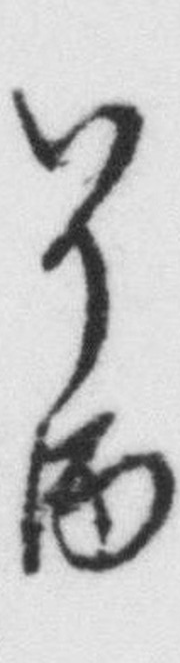いり酒
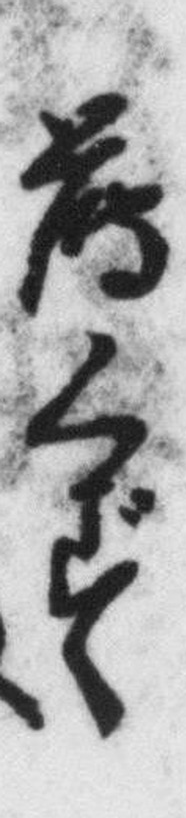薄くず
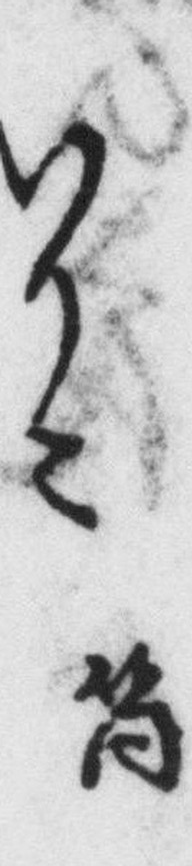いりこ筒
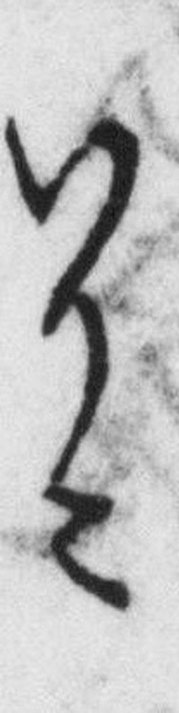いり酒
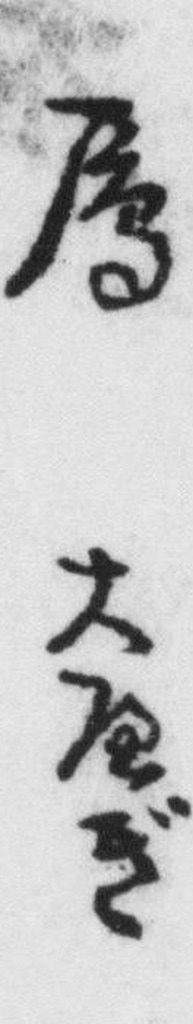鴈大へぎ

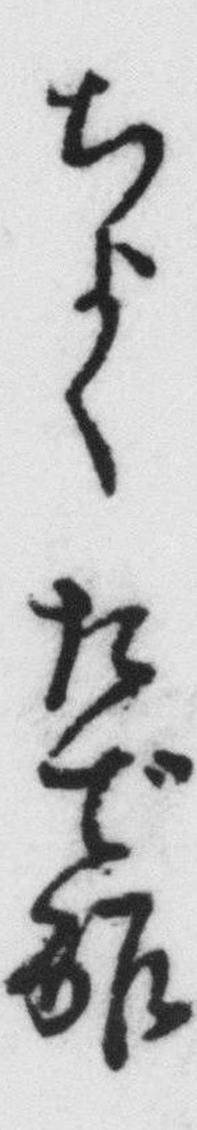ちよくたで酢
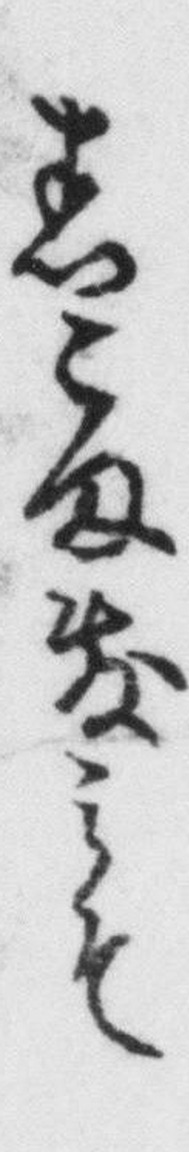黒こま敷みそ
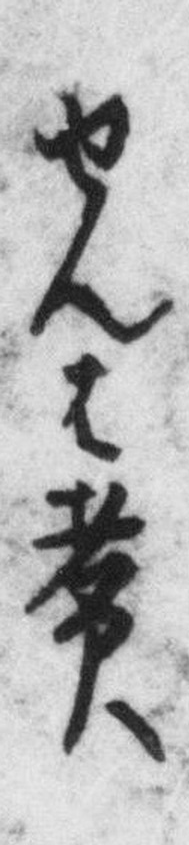せんば煮
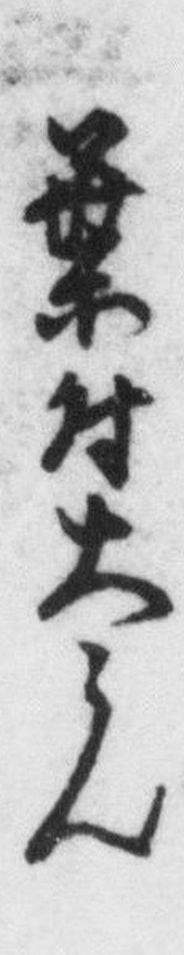葉付大こん

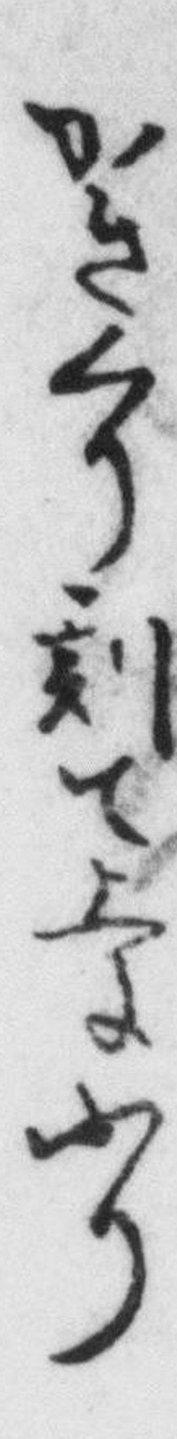かきくり刻て上にふり
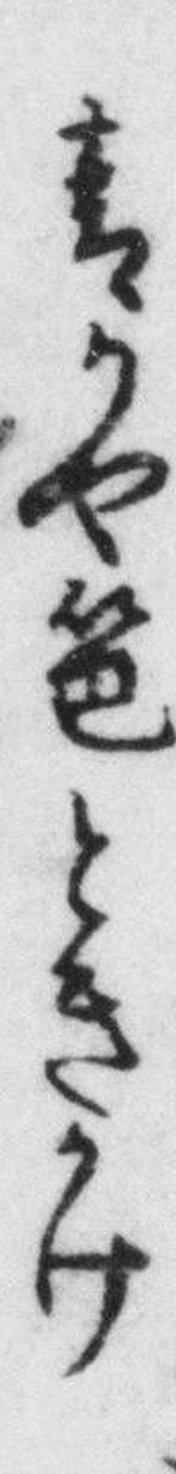青かやときかけ
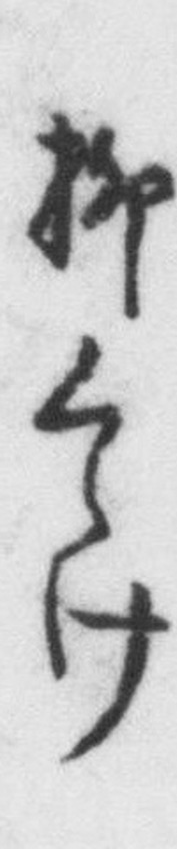柳くらけ
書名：卓子料理仕様
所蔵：大阪府立大学学術情報センター 国文学研究資料館
